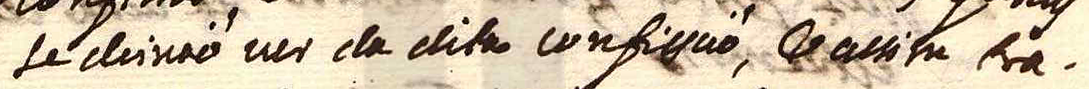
se deixaõ uer da dita confissaõ, & assim tra
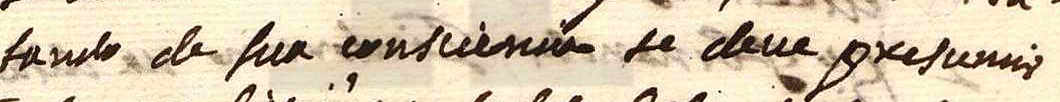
tando de sua consciencia se deue presumir
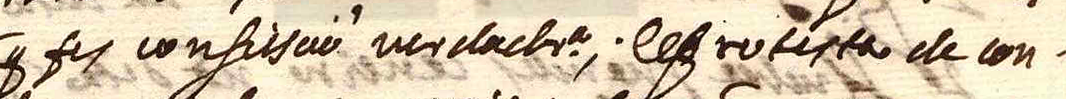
q̄ fes confissaõ uerdadr.a, & protesta de con
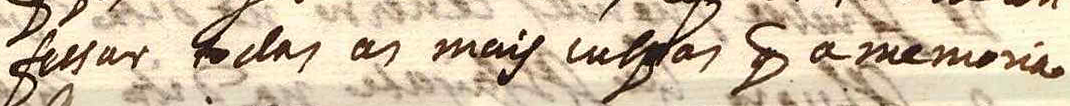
fessar todas as mais culpas q̄ a memoria
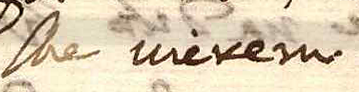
lhe uierem.
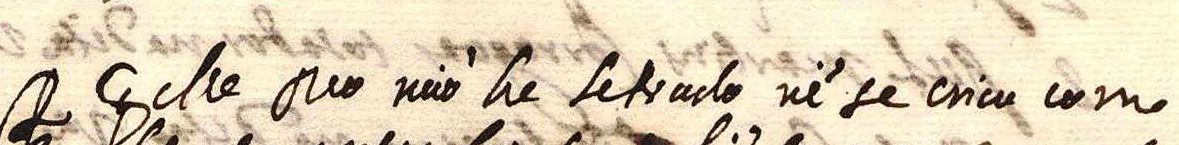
P q̄ elle Reo naõ he letrado nē se criou com
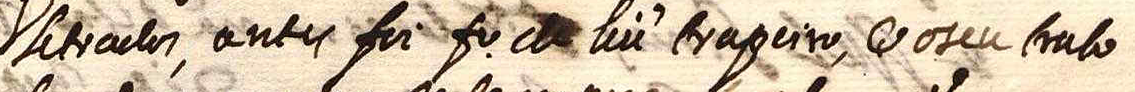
letrados, antes foi fo. de hū trapeiro, & o seu trato
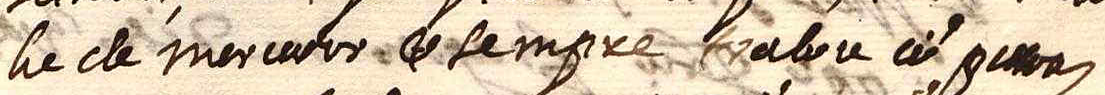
he elle mercador & sempre tratou cō pessoas
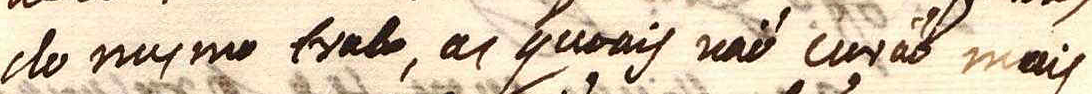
do mesmo trato, as quoais naõ curaõ mais
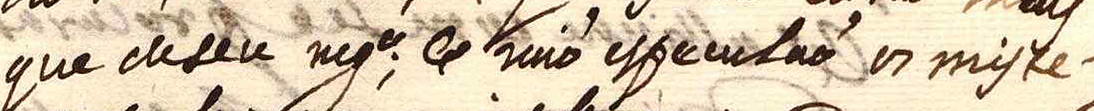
que de seu negco; & naõ especulaõ os myste
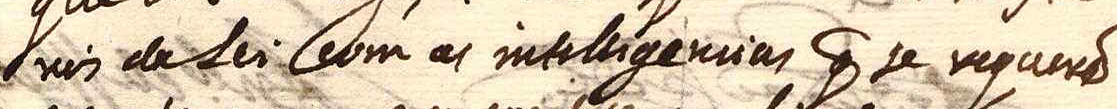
rios da Lei com as intelligencias q̄ se requerē
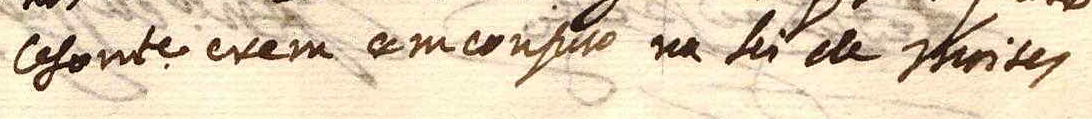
& somte crem em confesso na lei de Moises
